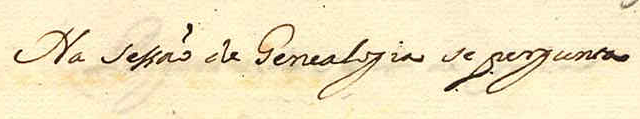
Na sessaõ de Genealogia se pergunta
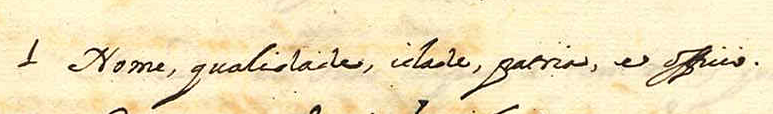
1 Nome, qualidade, idade, patria, e officio.
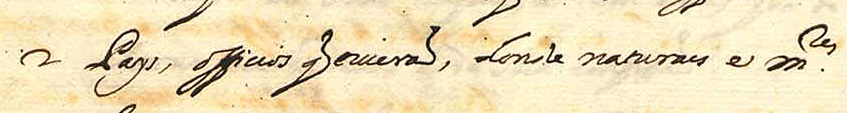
2 Pays, officios q̄ tiueraõ, donde naturaes e mres.
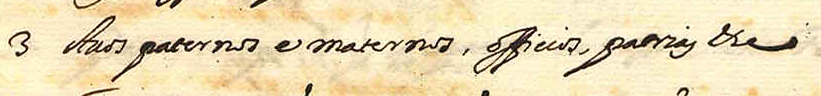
3 Auos paternos e maternos, officios, patrias &a
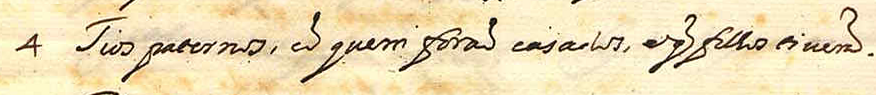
4 Tios paternos, cō quem foraõ casados, e q̄ filhos tiuerā.
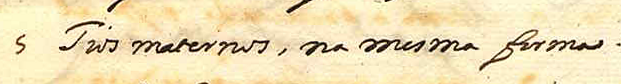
5 Tios maternos, na mesma forma.
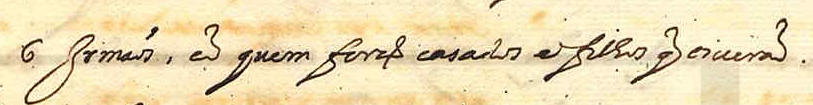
6 Jrmaõs, cō quem foraõ casados e filhos q̄ tiueraõ.
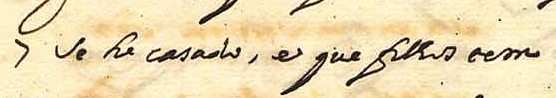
7 Se he casado, e que filhos tem
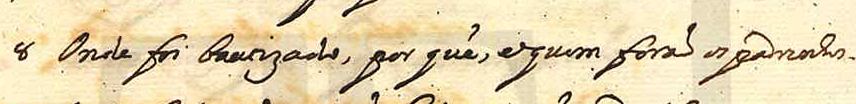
8 Onde foi bautizado, por quē, e quem foraõ os padrinhos.
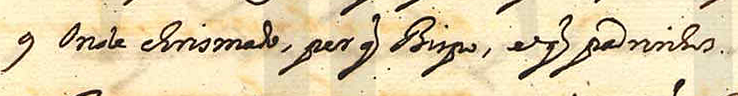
9 Onde chrismado, por q̄ Bispo, e q̄ padrinhos.
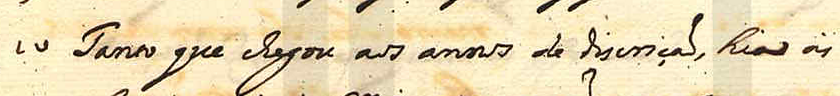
10 Tanto que chegou aos annos de discriçaõ, hia as
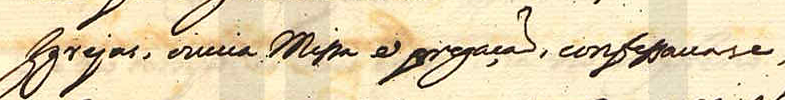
Jgrejas, ouuia Missa e pregaçaõ, confessauase,
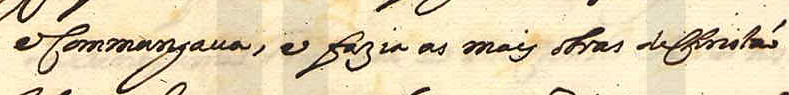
e Commungaua, e fazia as mais obras de Christaõ.
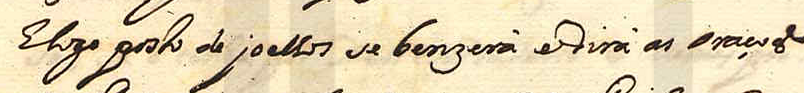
E logo posto de joelhos se benzerà e dirà as oraçoẽs
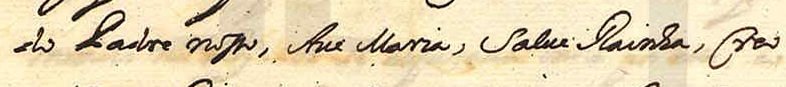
do Padre nosso, Aue Maria, Salue Rainha, Creo
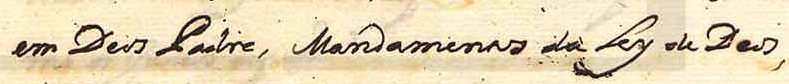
em Deos Padre, Mandamentos da Ley de Deos,
